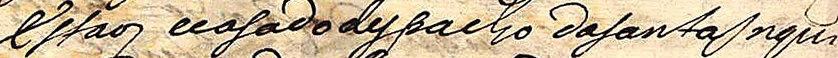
Estaos e casa do despacho da santa Jnqui
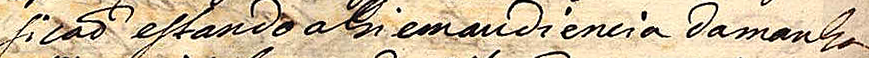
sicão estando ahi em audiencia da manha
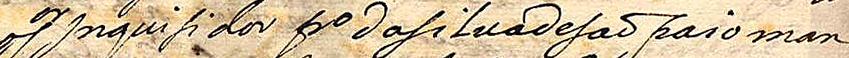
o sor Jnquisidor po da silua de saõpaio man
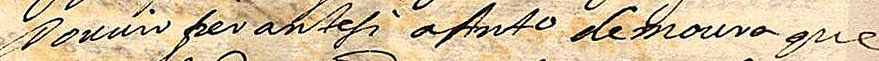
dou uir perante si a Anto de moura que
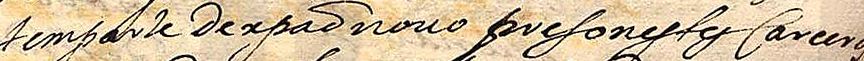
tem parte de xpão nouo preso nestes Carceres
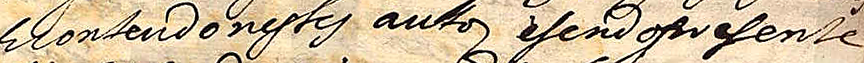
E conteudo nestes autos e sendo presente
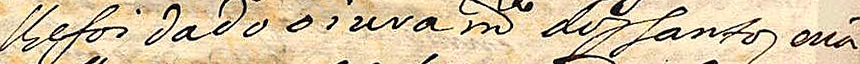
lhe foi dado o iuramro dos santos euā
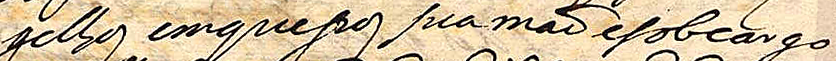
gelhos em que pos sua maõ e sob cargo
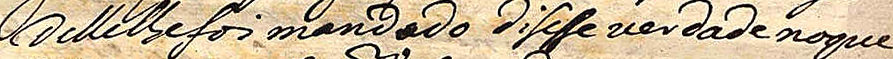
delle lhe foi mandado disesse uerdade no que
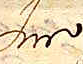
Iuro
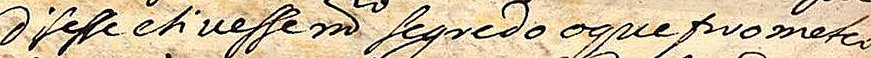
disesse e tiuesse mto segredo o que prometeo
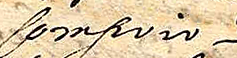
Comprir
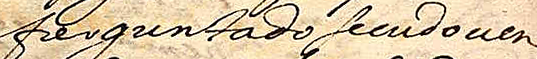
preguntado se cudou em
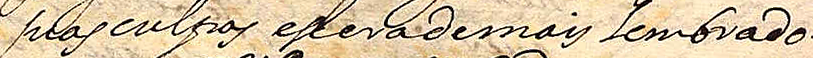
suas culpas e se era de mais Lembrado
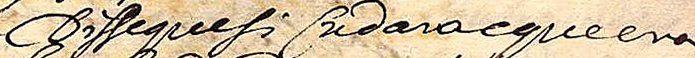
Disse que si Cudara e que era
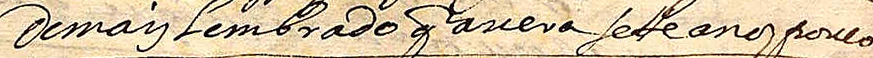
De mais Lembrado q̄ auera sette anos pouco
